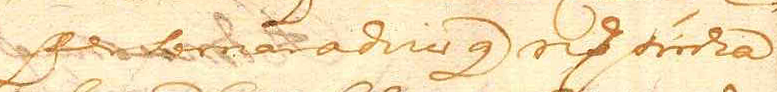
por tornar a dizer q̄ nā tinha
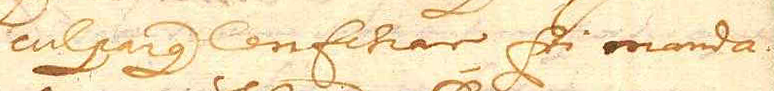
culpas q̄ Confessar, foi manda
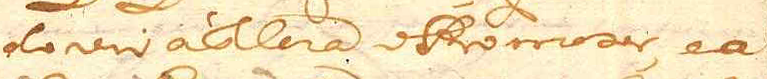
do vir á Meza o Promotor, e a
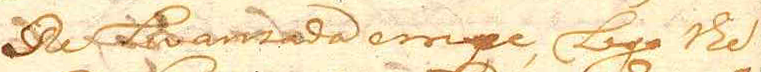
Re Levantada em pe, Logo lhe
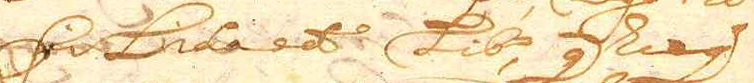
foi Lido o d̄o Libo, q̄ he o q̄
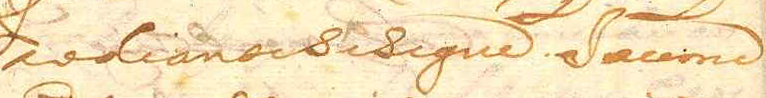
ao diante se segue Iacome
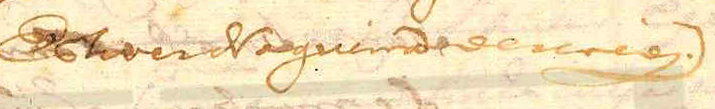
Esteves Nogueira o escrevj.
